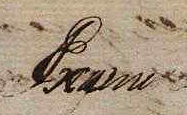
Exame
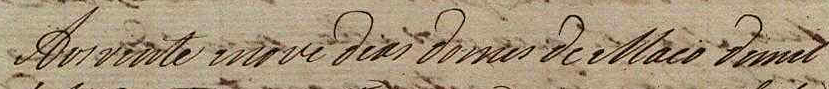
Aos vinte e nove dias do mes de Maio de mil
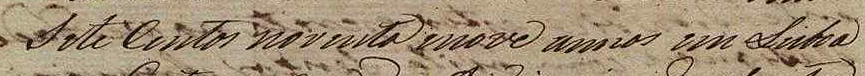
seteCentos noventa e nove annos em Lisboa
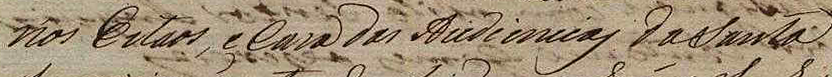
nos Estaos, e Caza das Audiencias da Santa
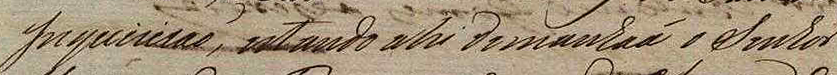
Jnquiziçaõ, estando ahi de manhaã o Senhor
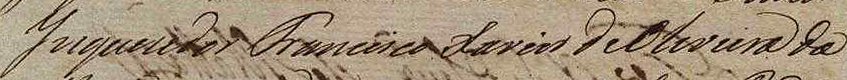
Jnquisidor Francisco Xavier de Oliveira da
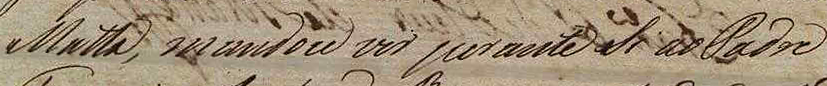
Matta, mandou vir perante si ao Padre
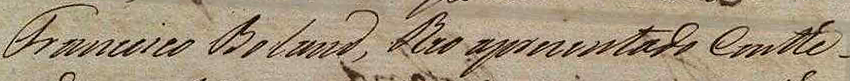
Francisco Boland, Reo aprezentado Conthe
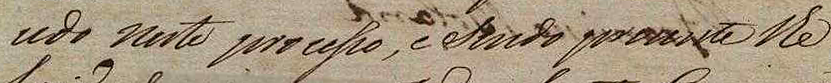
udo neste processo, e sendo prezente lhe
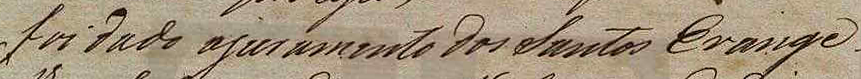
foi dado o juramento dos Santos Evange
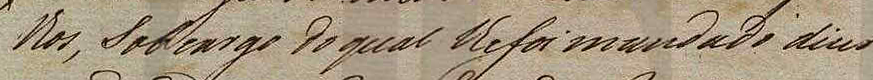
lhos Sob cargo do qual lhe foi mandado dizer
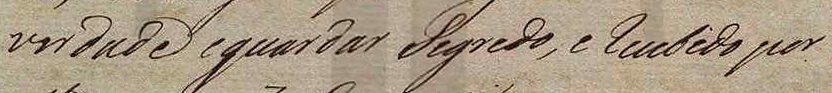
verdade e guardar Segredo, e Recebido por
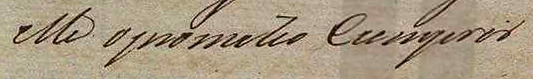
elle o prometeo cumprir
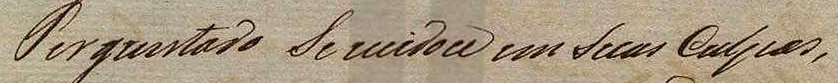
Perguntado Se cuidou em suas Culpas,
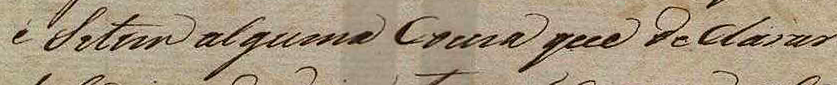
e Se tem alguma Couza que declarar
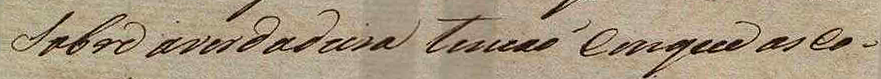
sobre a verdadeira tençaõ em que as co
